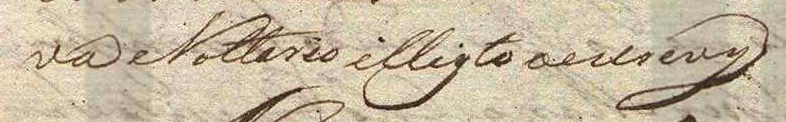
va Nottario illeyto o escrevy
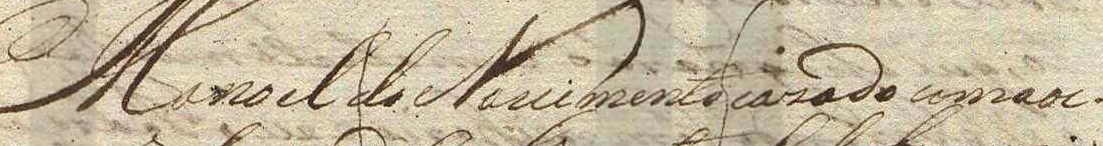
Manoel do Nascimento cazado com a oc
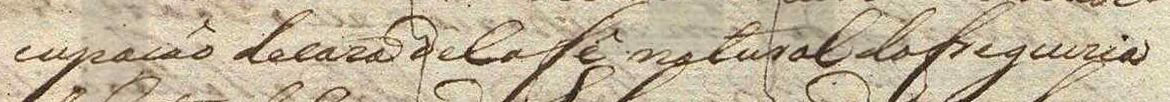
cupacaõ de caza de Café natural da freguezia
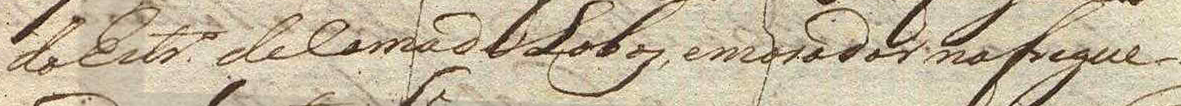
do Estr.o de Cama de Lobos, e morador na fregue
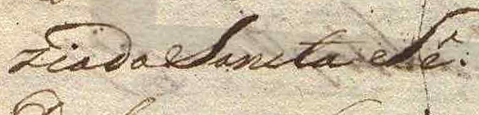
zia da Sancta Sé.
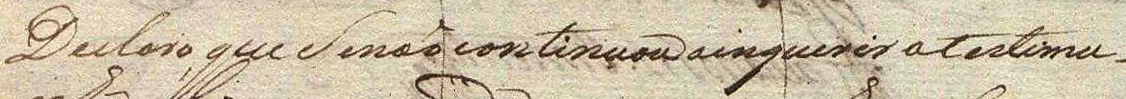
Declaro, que Senaõ continuou a inquirir a testimu P eclaraçaõ
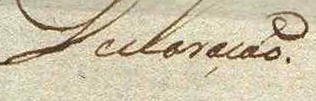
Declaraçaõ.
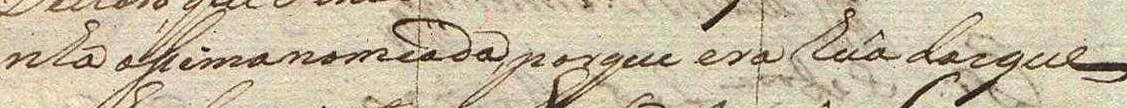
nha assima nomeada, porque era huā das que
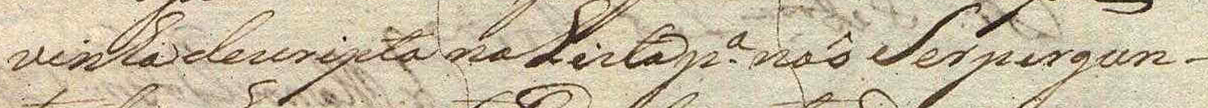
vinha descripta na Lista p.a naõ Ser pergun
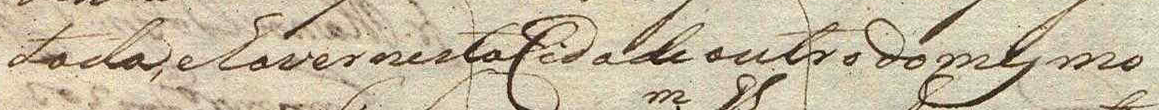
tada, e haver nesta Cidade outro do mesmo
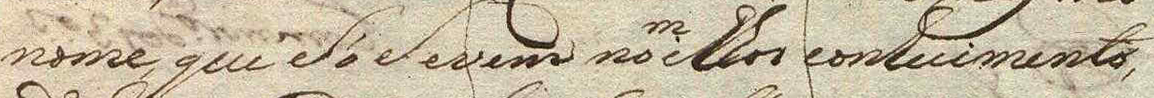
nome que Só Se vem no melhor conhecimento,
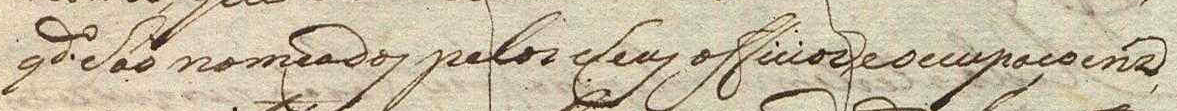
q.do Sao nomeados pelos Seus, officioz, e occupaçoenz,
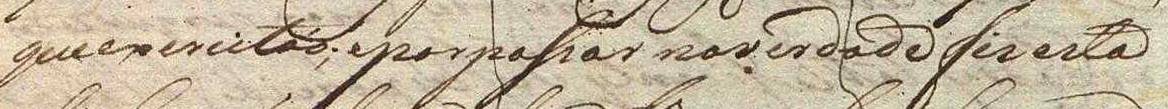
que exercitaõ, e por passar na verdade fiz esta
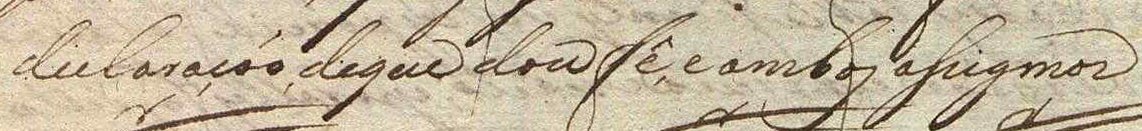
declaração, de que dou fé, e ambos assigmoz
